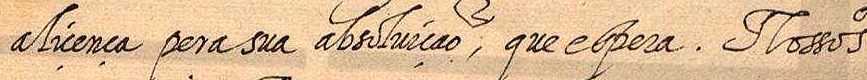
a liçença pera sua absoluiçaõ, que espera. Nosso s.or
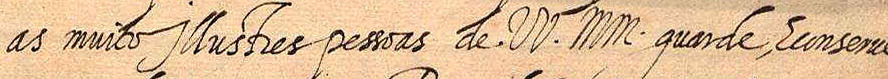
as muito Jllustres pessoas de .VV. MM. guarde, E conserue
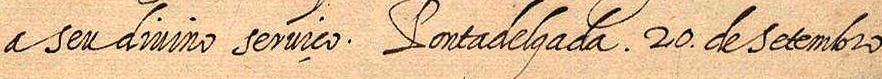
a seu diuino seruiço. Ponta delgada. 20 de Setembro
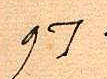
97.
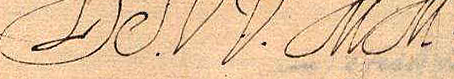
De VV. MM.
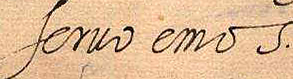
Seruo em o s.or
